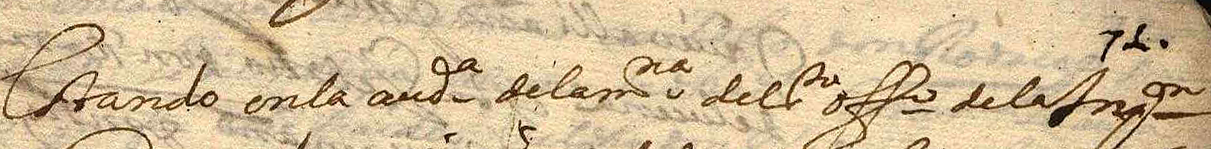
Estando en la aud.a de la mna. del s.to off.o de la Inqon
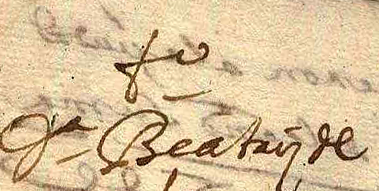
D.a Breatiz de
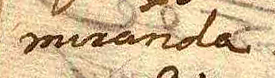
miranda
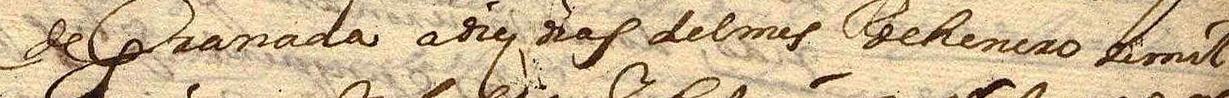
de Granada a diez dias del mes de henero de mil
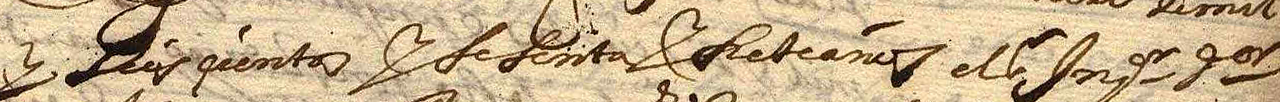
y seiscientos y sesenta y siete an̄os el sr Jnq.or d.or
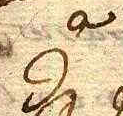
9a
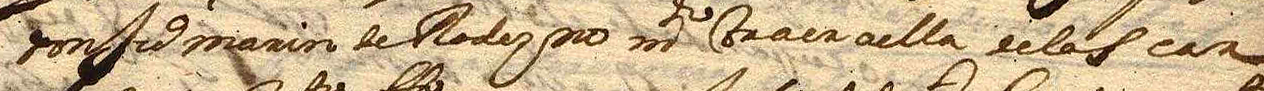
don Juo marin de Rodezno mdo traer a ella de las car
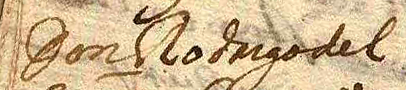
Don Rodrigo del
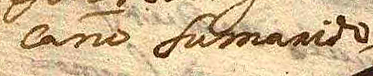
Canõ su marido
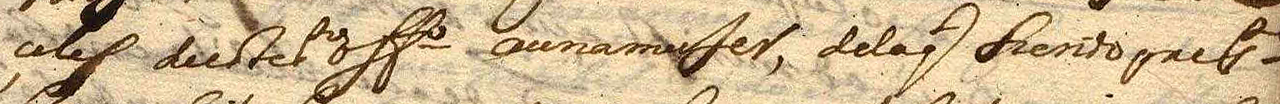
celes de este sto off.o a una muJer, de la q̄ siendo preste
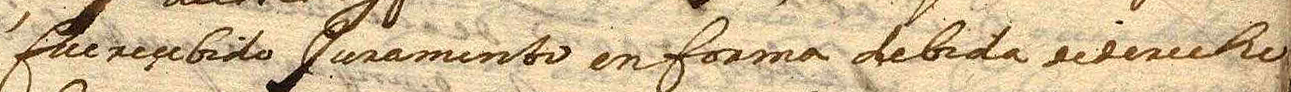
fue recebido Juramento en forma debida de derecho
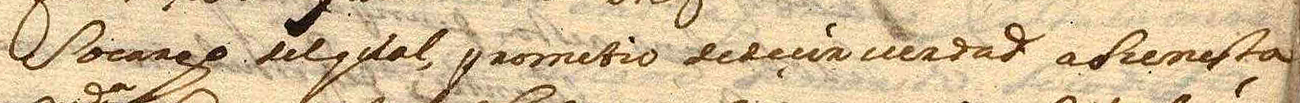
So cargo del qual, prometio de decir uerdad asi en esta
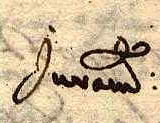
Juramto
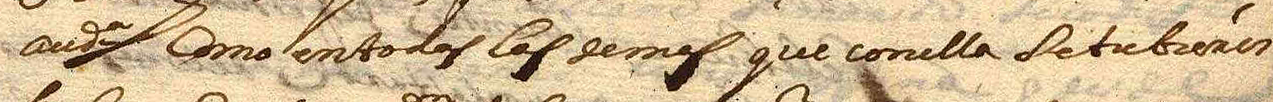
auda Como en todas las demas que con ella se tubieren
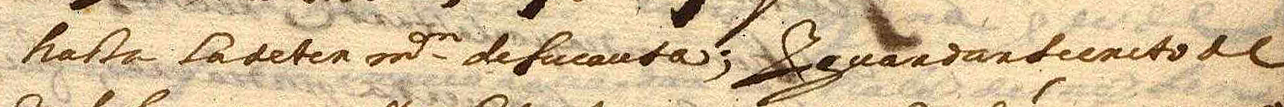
hasta la determ.on de su causa; Y guardar secreto de
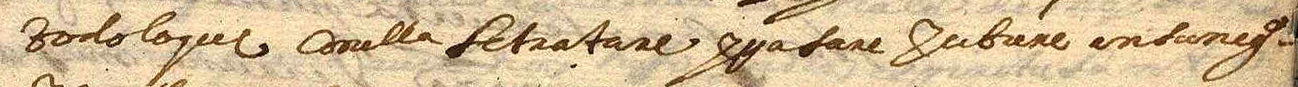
todo lo que con ella se tratare y pasar y ubiere en su neg.o
